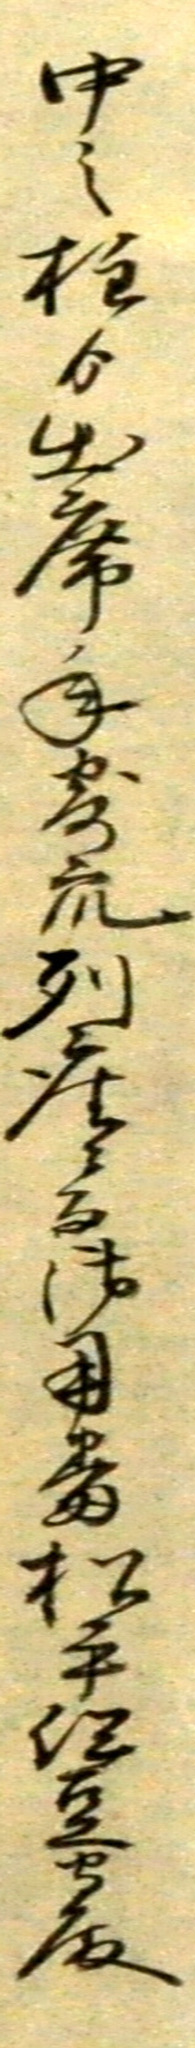中之柱ゟ出席年寄衆列座ニ而御用番松平伊豆守殿
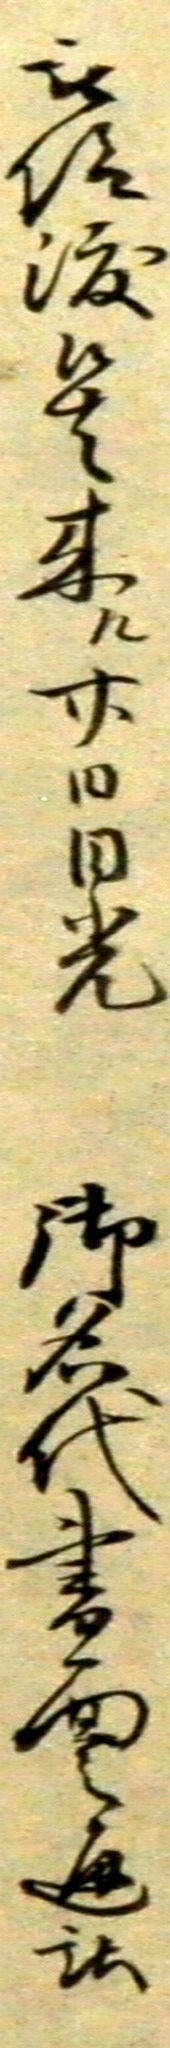被仰渡候者来ル廿日日光御名代書面之通被
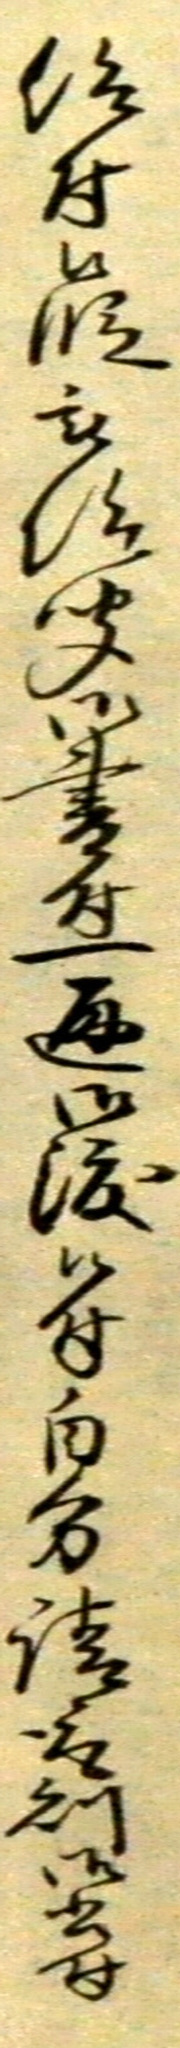仰付候段被仰聞御書付一通御渡候付自分請取則御書付

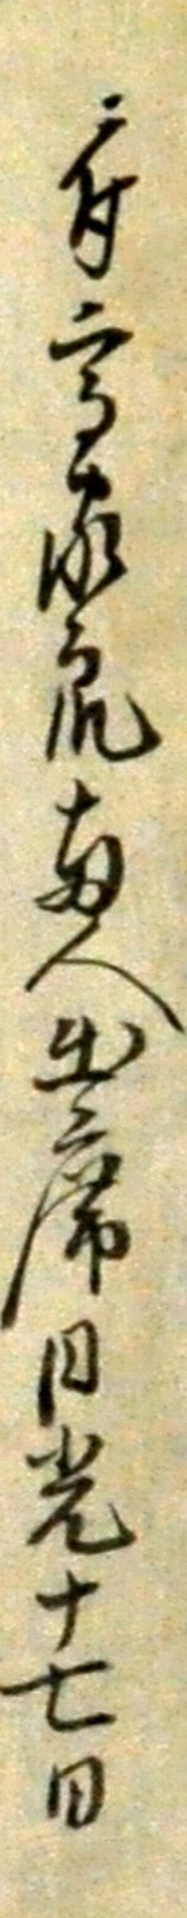二付高家衆両人出席日光十七日
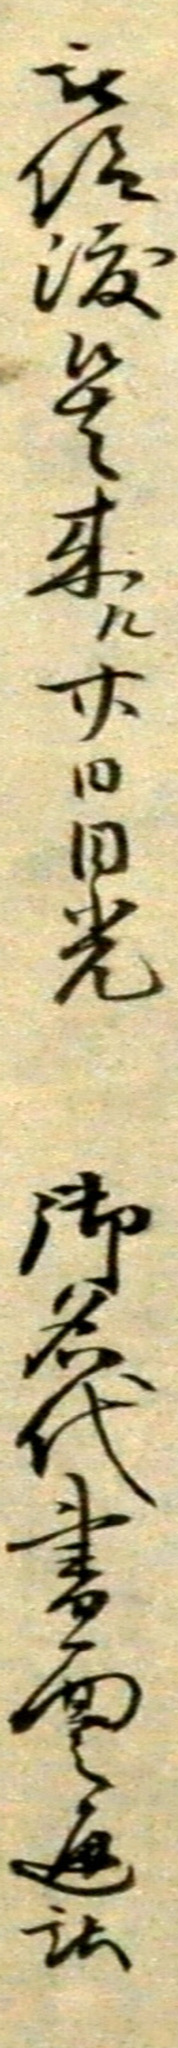被仰渡候者来ㇽ廿日日光御名代書面之通披
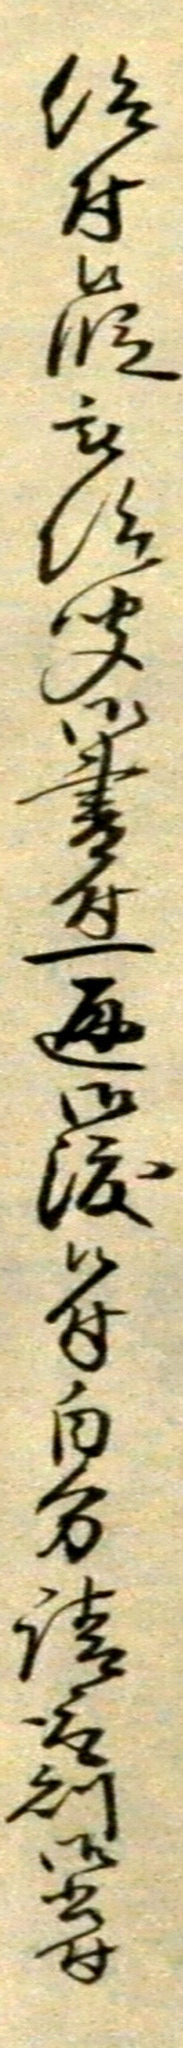仰付候段被仰聞御書付一通御渡候付自分請取則御書付
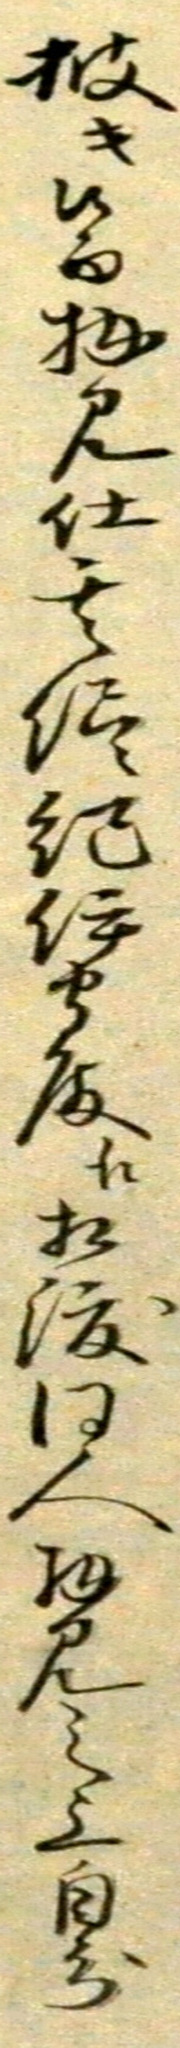披キ候而拝見仕其儘紀伊守殿江相渡同人拝見之上自分
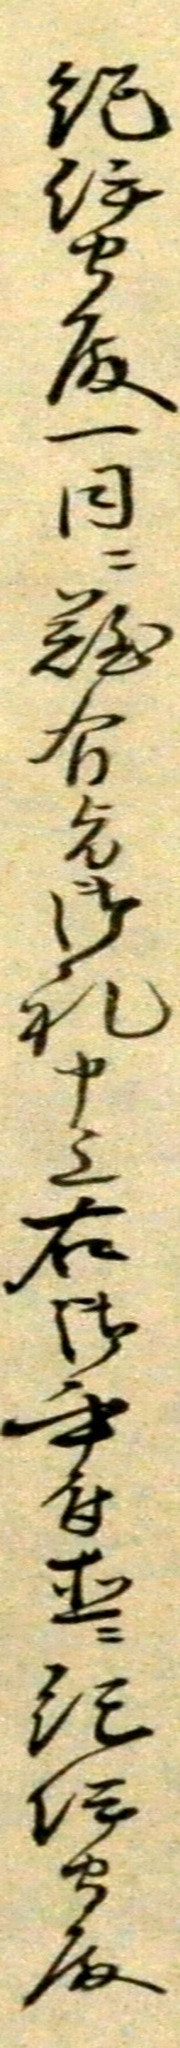紀伊守殿一同ニ難有旨御礼申上右御書付直ニ紀伊守殿
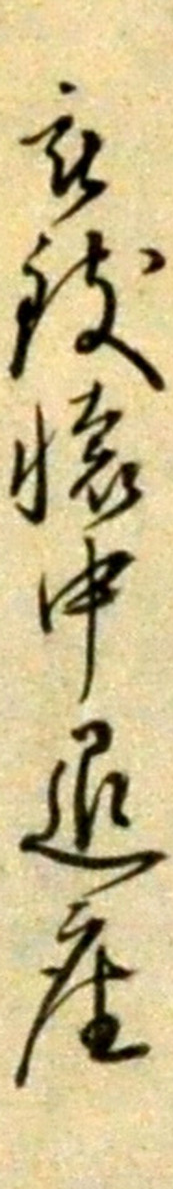被致懐中退座
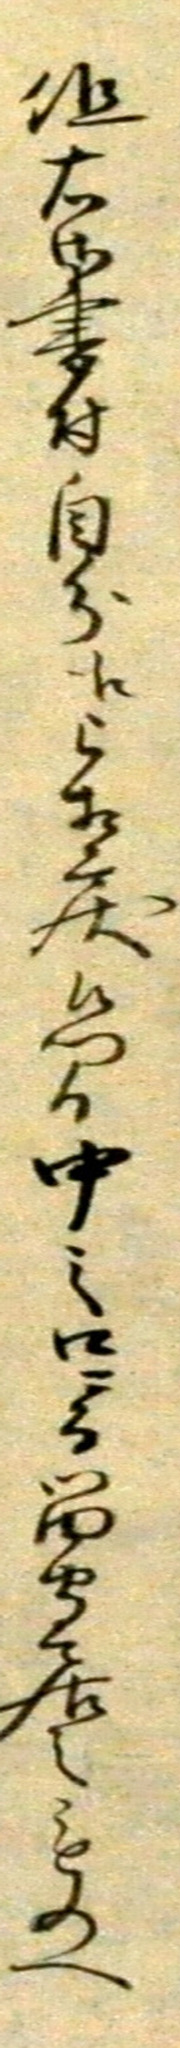但右御書付自分江被相戻候間中之口ニ而留守居之ものへ相渡ㇲ
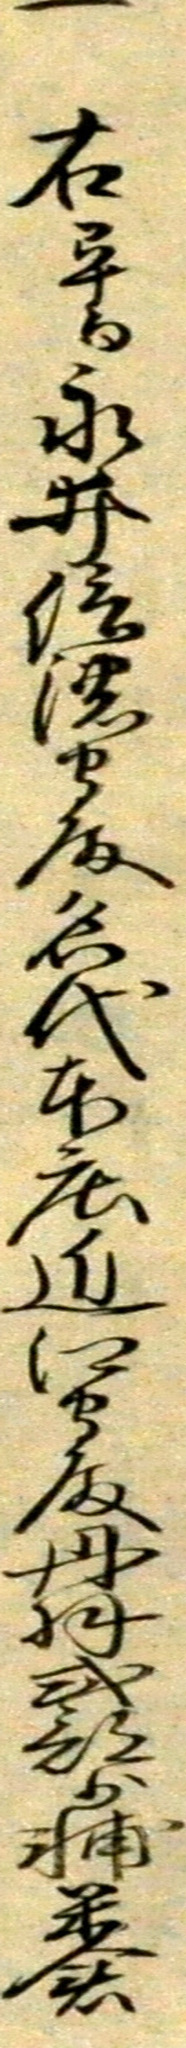一右畢而永井信濃守殿名代本庄近江守殿丹羽式部少輔米倉
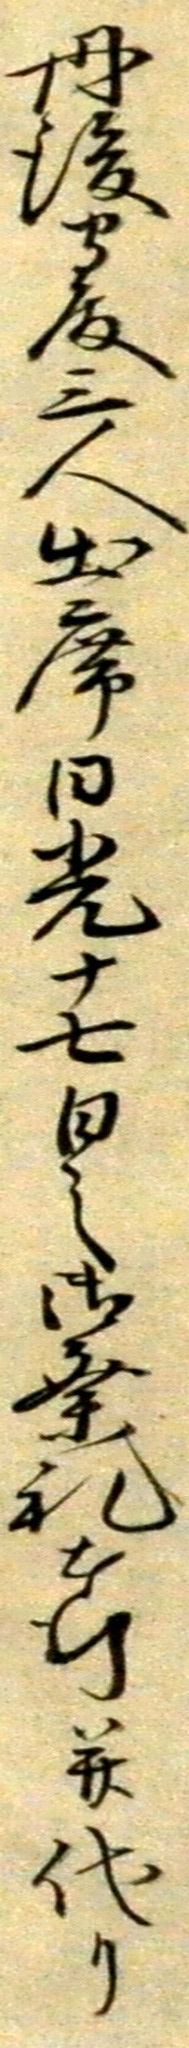丹後守殿三人出席日光十七日之御祭礼奉行幷代り
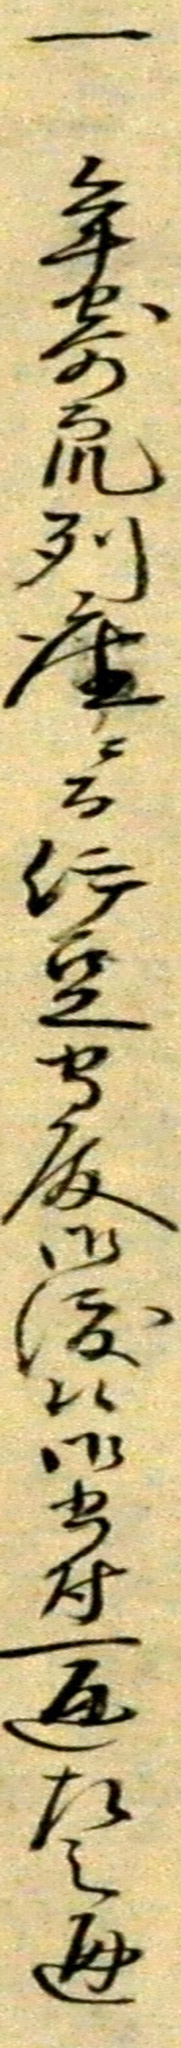一年寄衆列座ニ而伊豆守殿御渡候御書付一通左之通
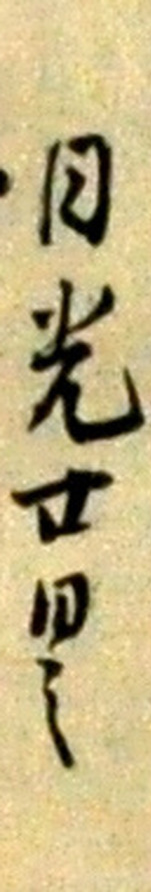日光廿日之
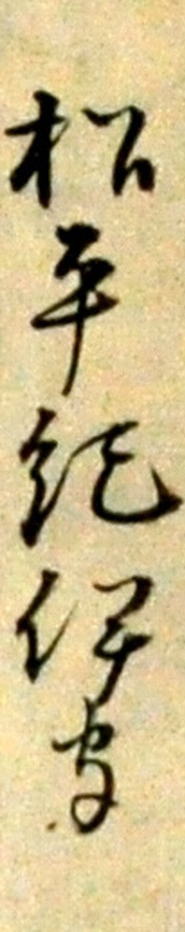松平紀伊守
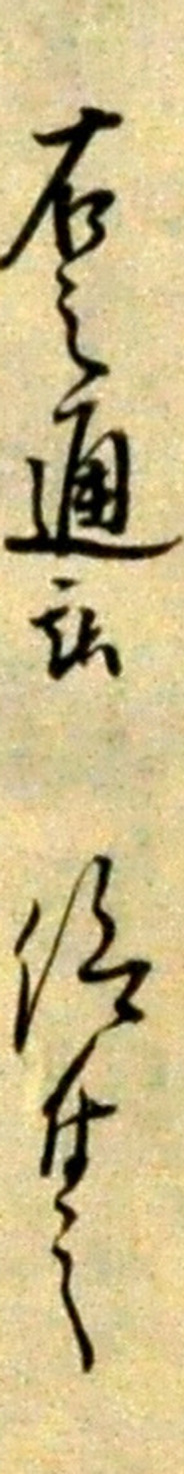右之通被仰付之
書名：日光御名代相勤候節ノ留
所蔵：伊那市立高遠町図書館・合同会社AMANE
